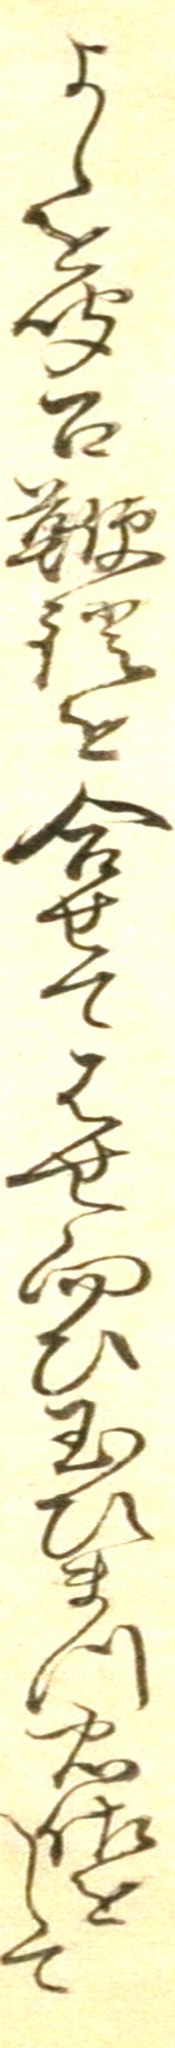よしを聞召鞭鐙を合せてはせ向ひ玉ひまつ忠佐をして
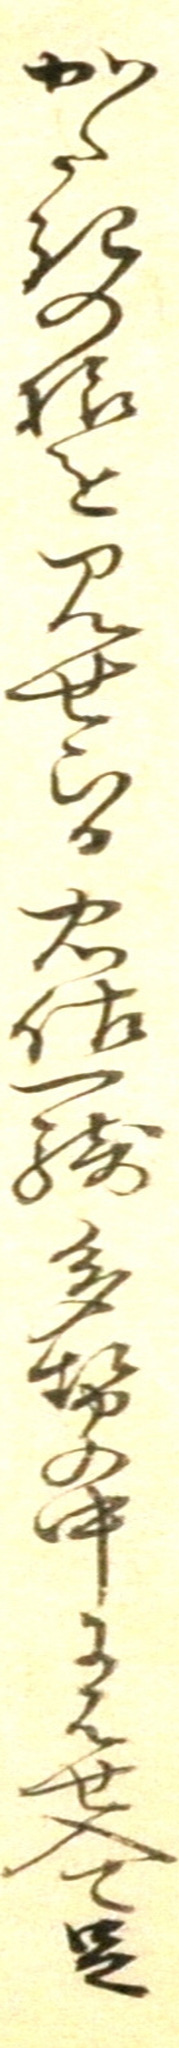かたきの様見せらる忠佐一騎多勢の中にはせ入て足
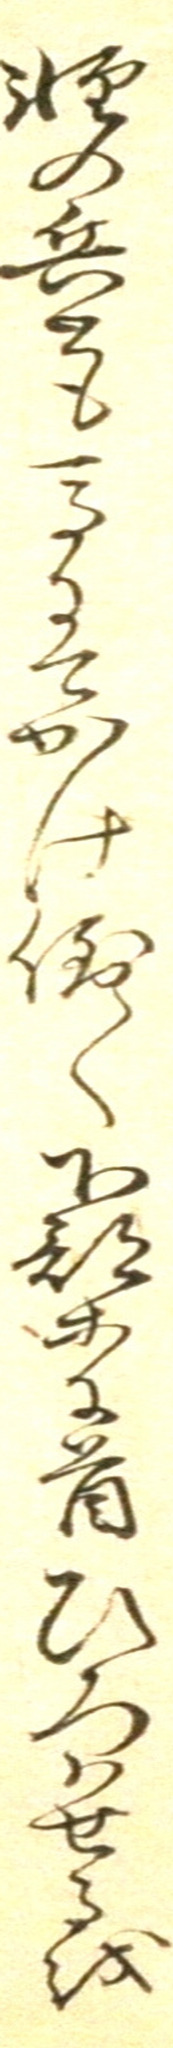軽の兵とも馬にてかけ働く下部等に首ひろはせるを
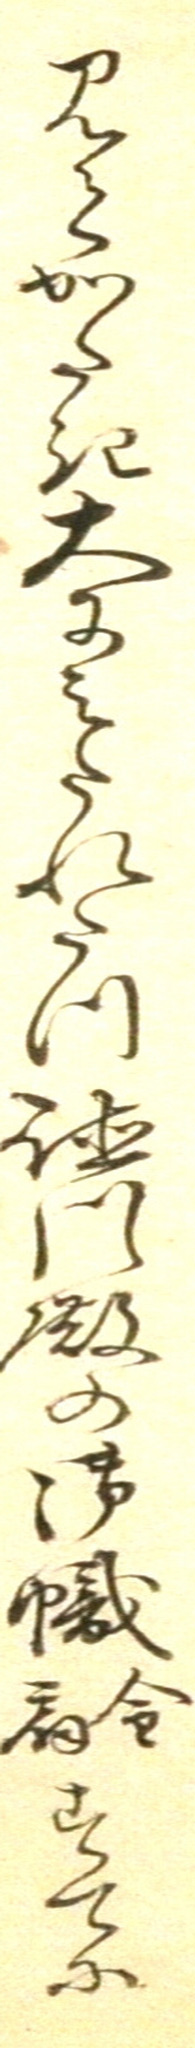見てかたき大にみたれたつ徳川殿の御幟金扇すてに
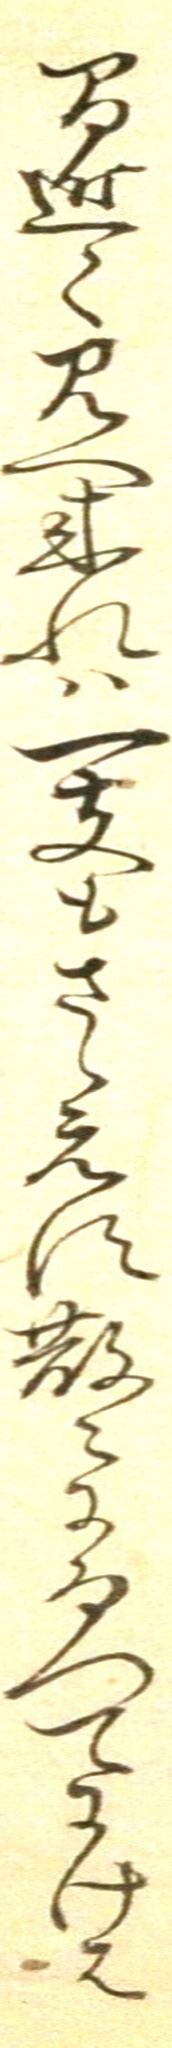間近く見へ来れは一支もさゝえす散々になつてにけは
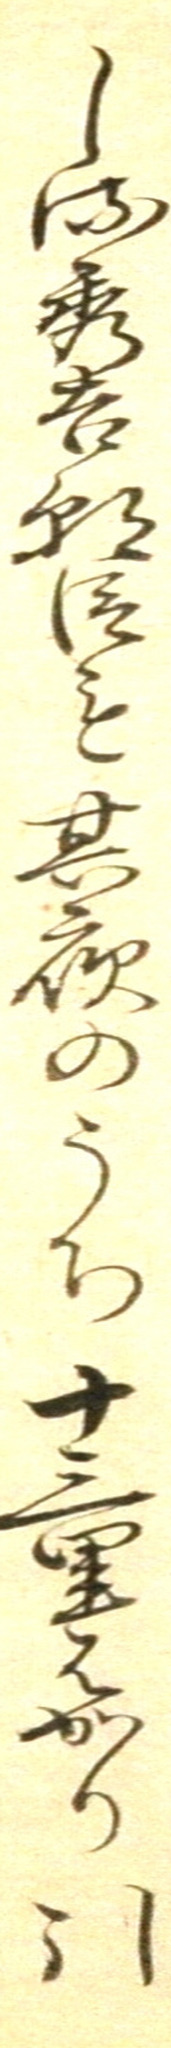しる秀吉朝臣も其夜のうち十三里はかり引
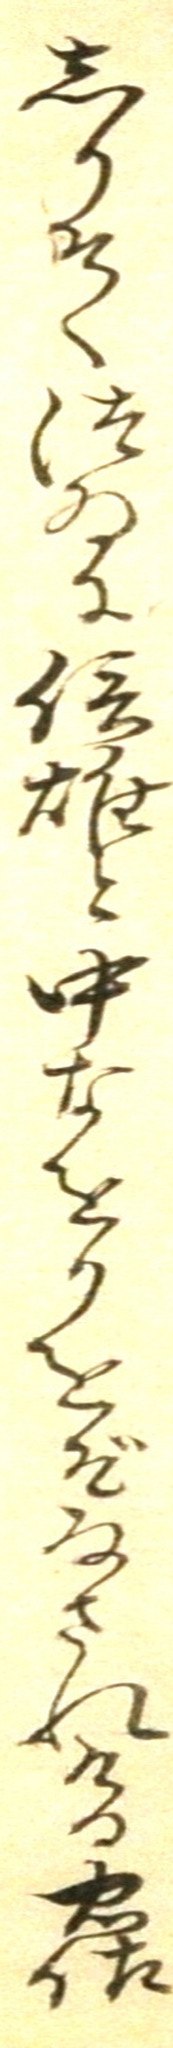しりそくつゐに信雄と中なをりをぞなされける忠佐
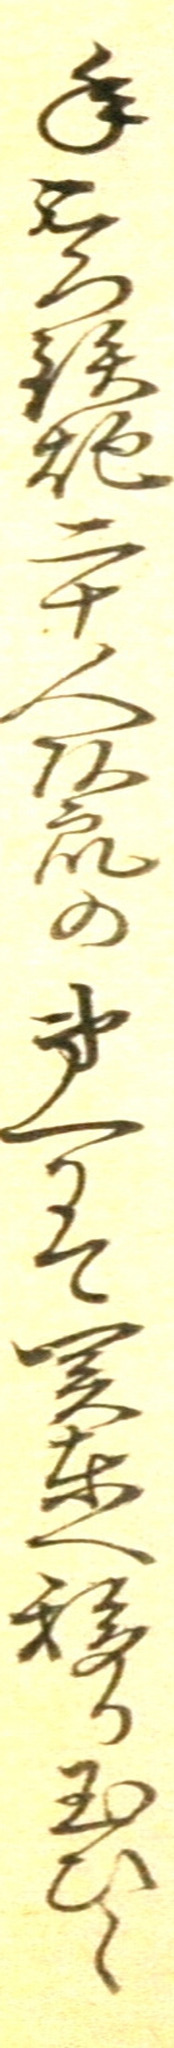年ころ鉄炮二十人頭衆の第一にて関東へ移り玉ひし

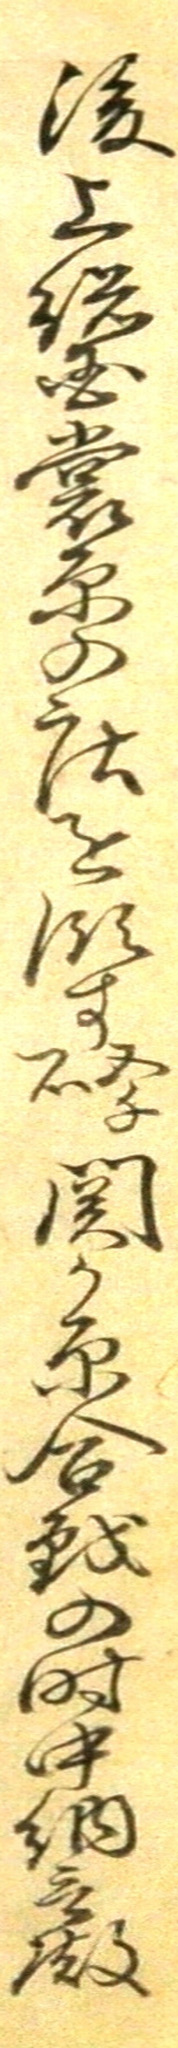後上総国裳原の庄を領す五千石関か原合戦の時中納言殿
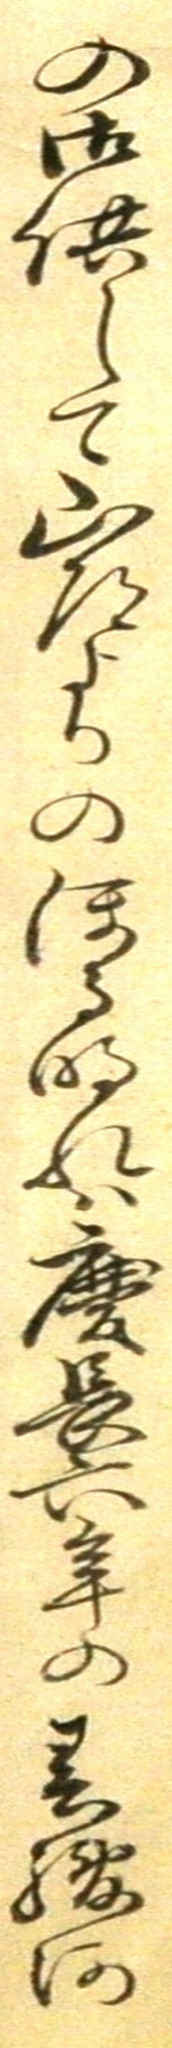の御供して山道よりのほる明れは慶長六年の春駿河
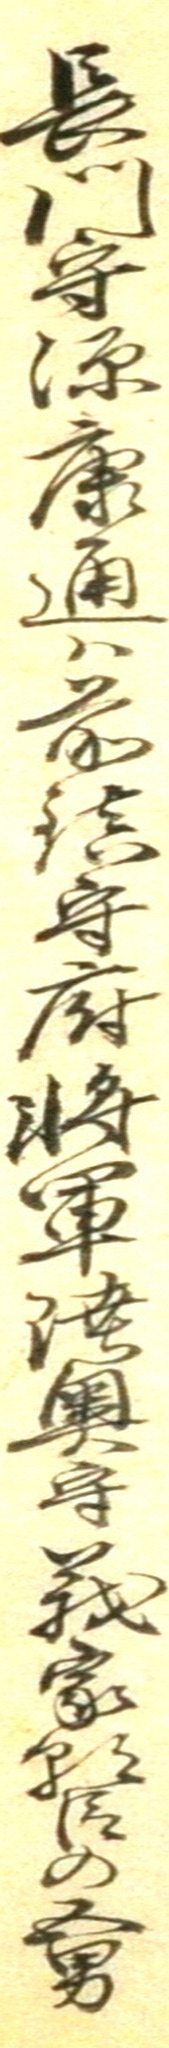長門守源康通は前ち鎮守府将軍陸奥守義家朝臣の五男
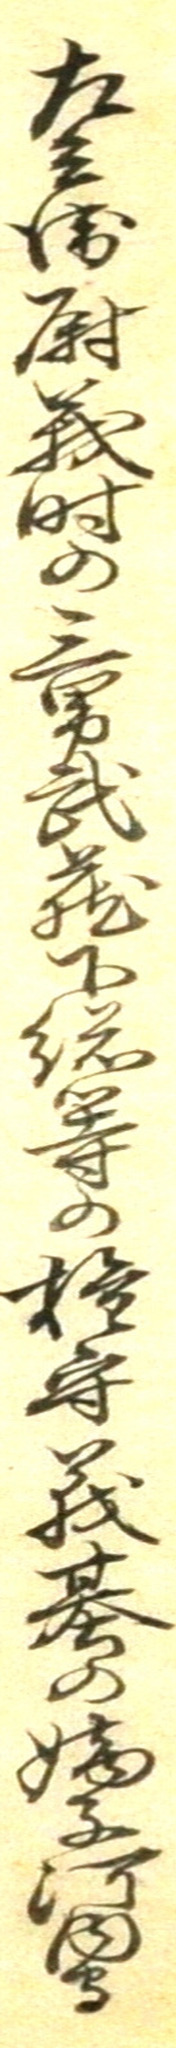左兵衛尉義時の三男武蔵下総等の権守義基の嫡子河内守
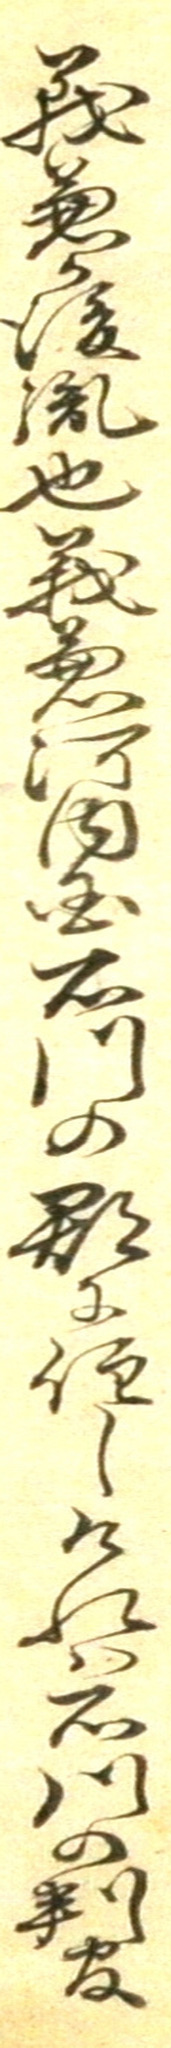義兼か後胤也義兼河内国石川の郡に住しけれは石川の判官
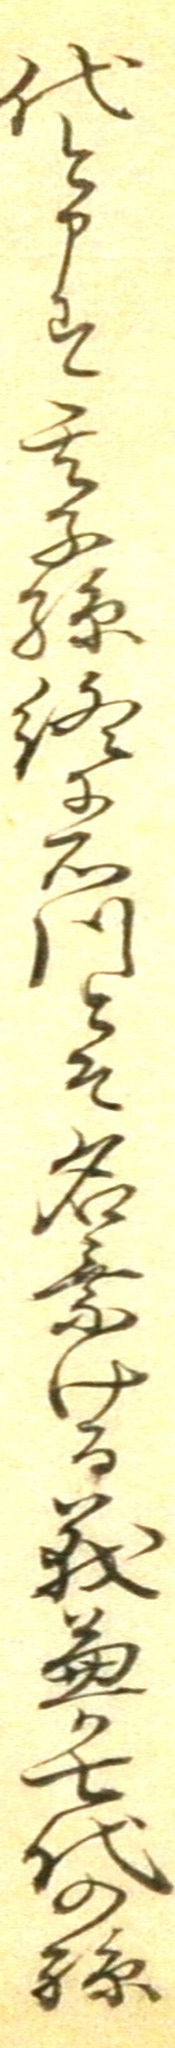代と申す其子孫終に石川とそ名乗ける義兼か七代の孫
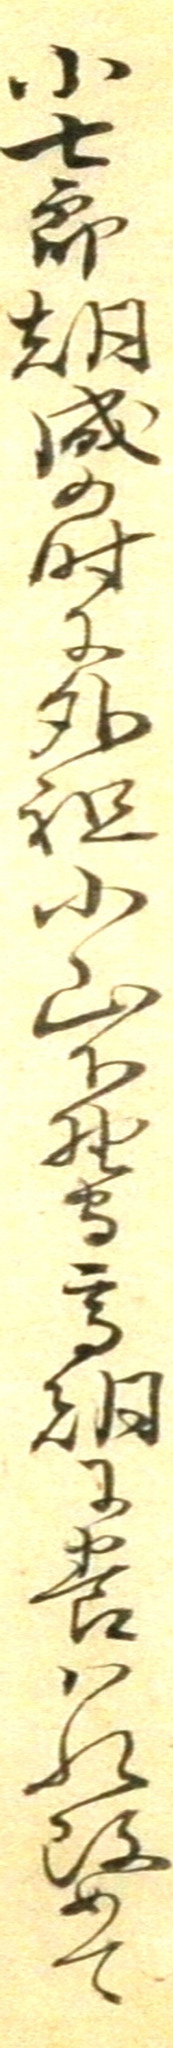小七郎朝成の時に外祖小山下野守高朝に養はれ改めて
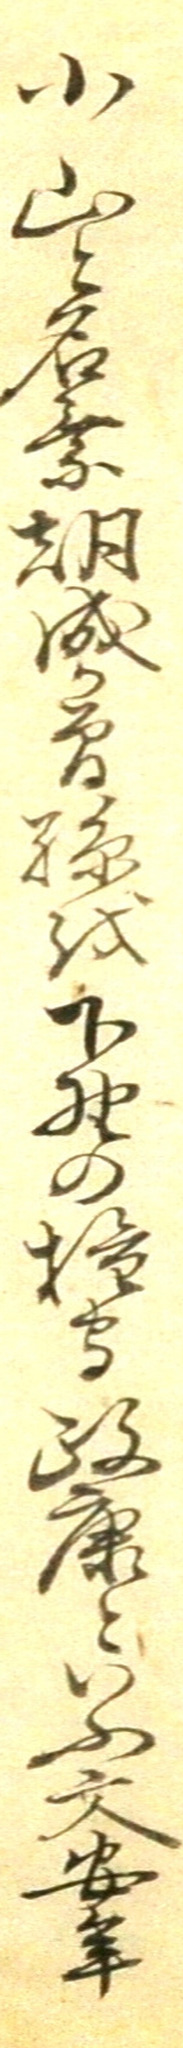小山と名乗朝成か曽孫を下野の権守政康といふ文安年
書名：藩翰譜（四・中）
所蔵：伊那市立高遠町図書館・合同会社AMANE
